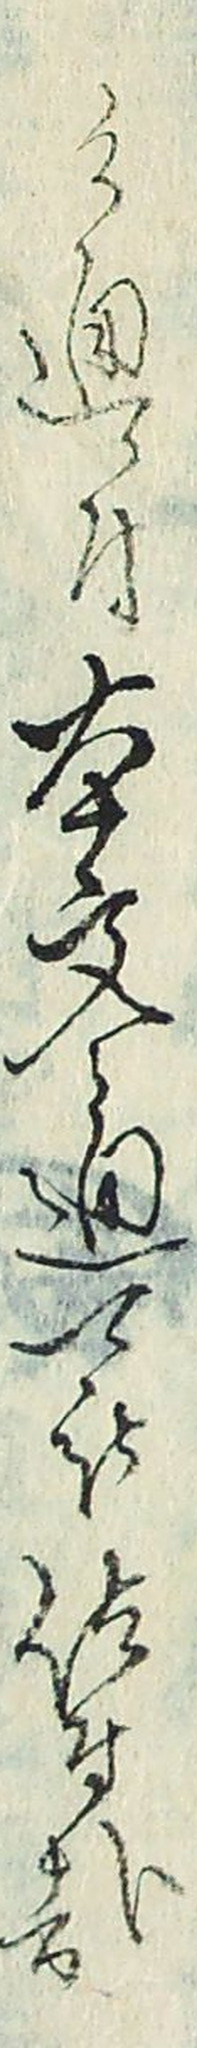候通ニ付本文之通可被仰付哉
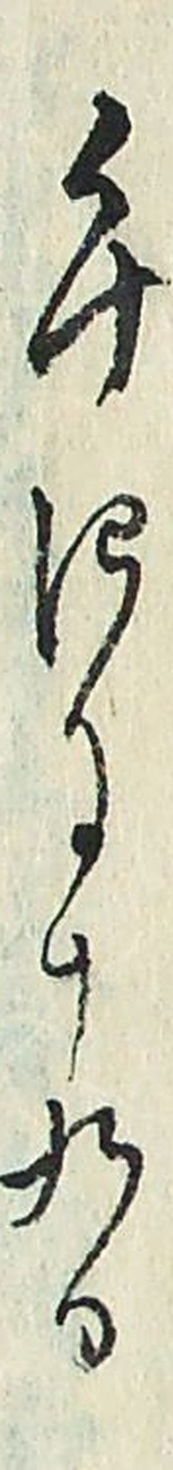午四月十九日

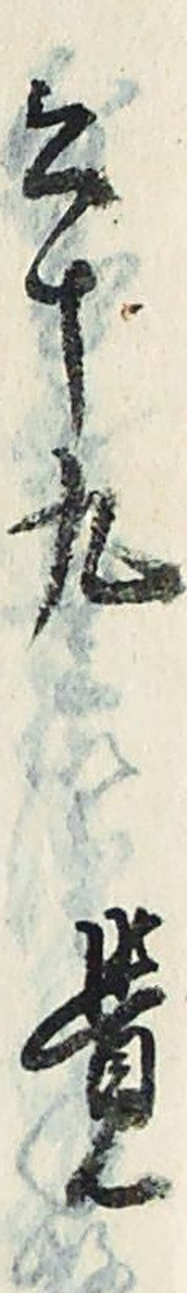六十九覺
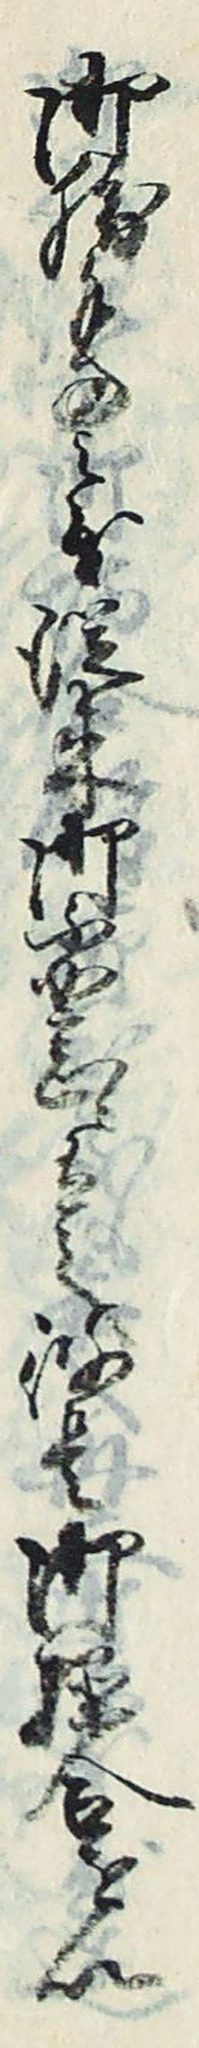御勝手方之義従来御不如意ニ有之彼是御繰合を以
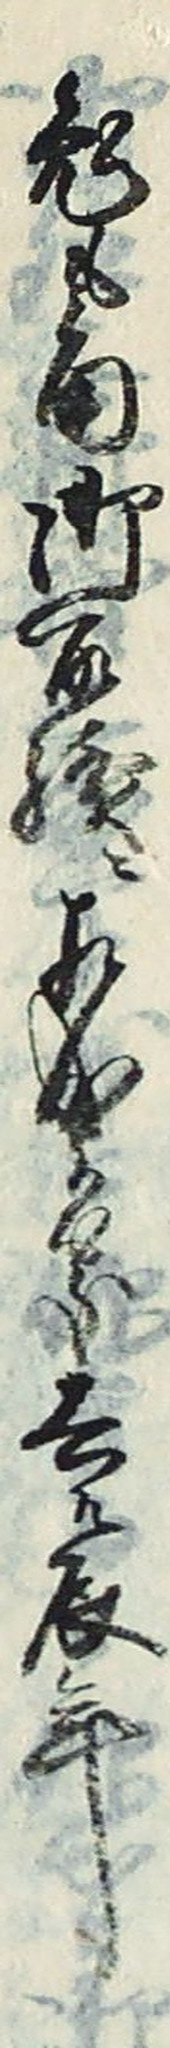兎も角御取續ニ相成候處去ル辰年
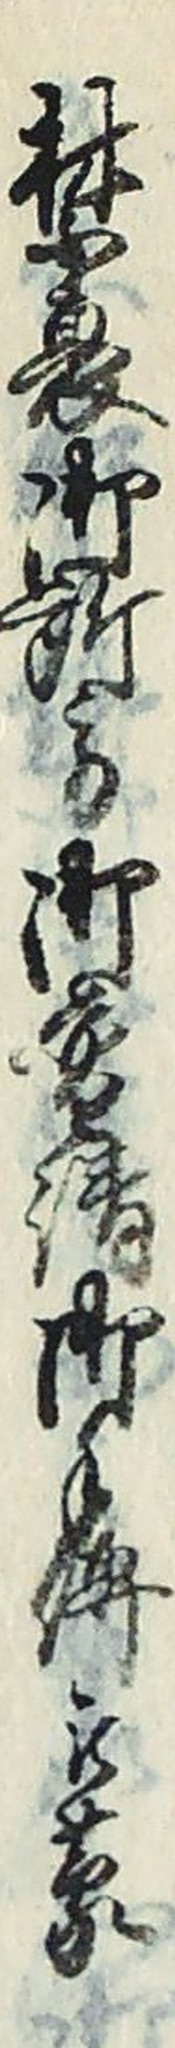禁裏御所方御普請御手傳被蒙
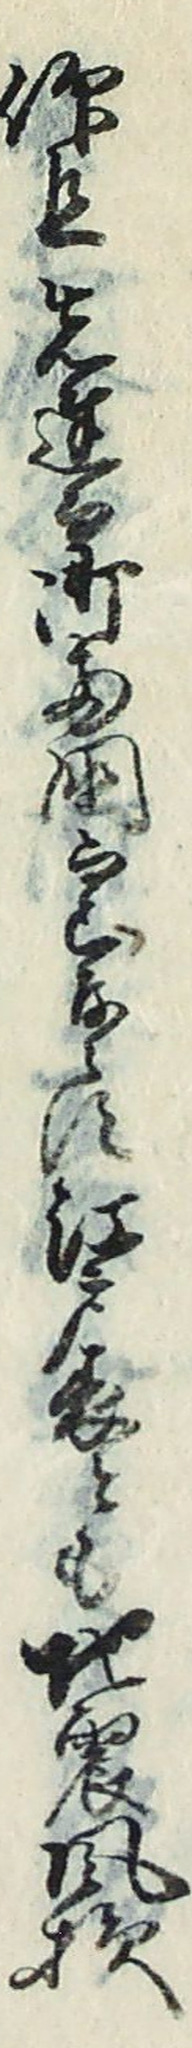仰且先達而御両国而已ならす江戸表とも地震風損
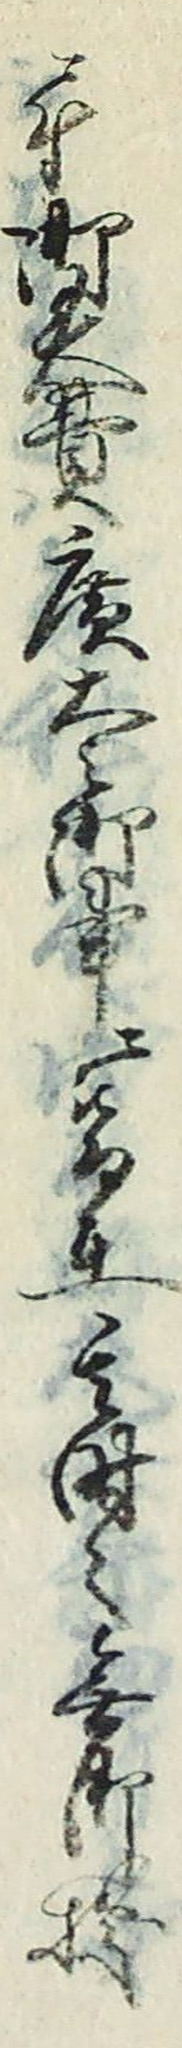ニ付御失費廣大之御事ニ被為在其時々無御據
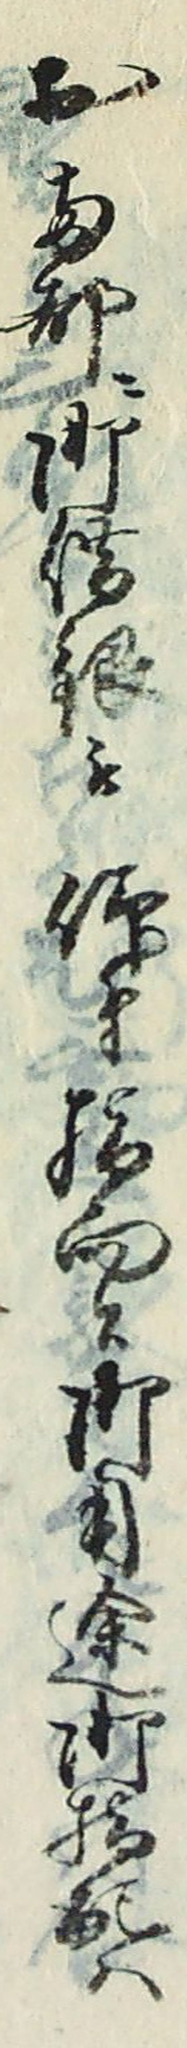於両都ニ御借銀被仰付指向候御用途御指配ハ
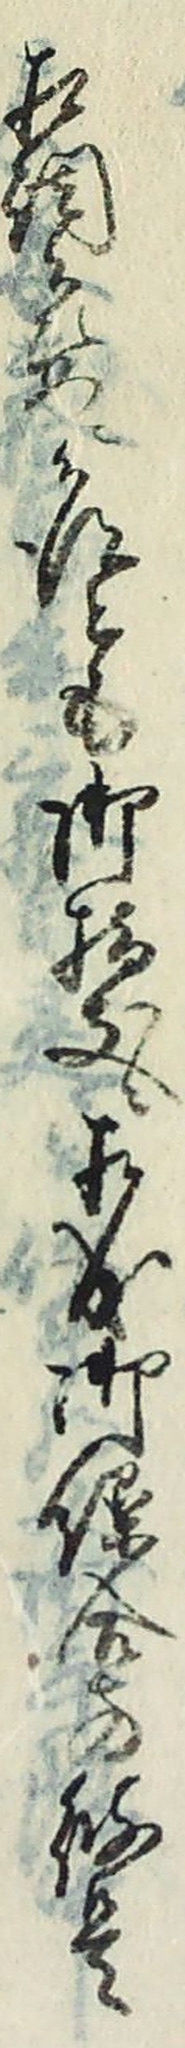相調候姿ニ候得とも御指支ニ相成御繰合方彼是
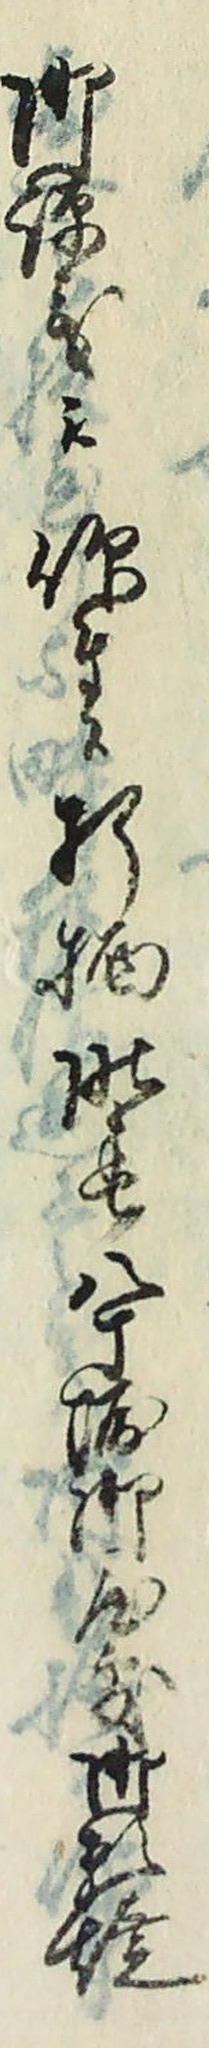御評義被仰付候折柄昨春八丁堀御屋敷御類燒
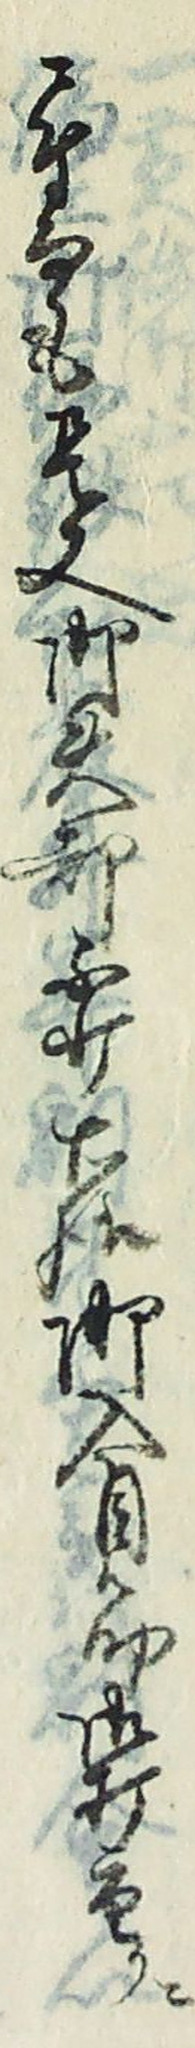ニ付ても是又御失却不少右様御入目筋御打重りニ
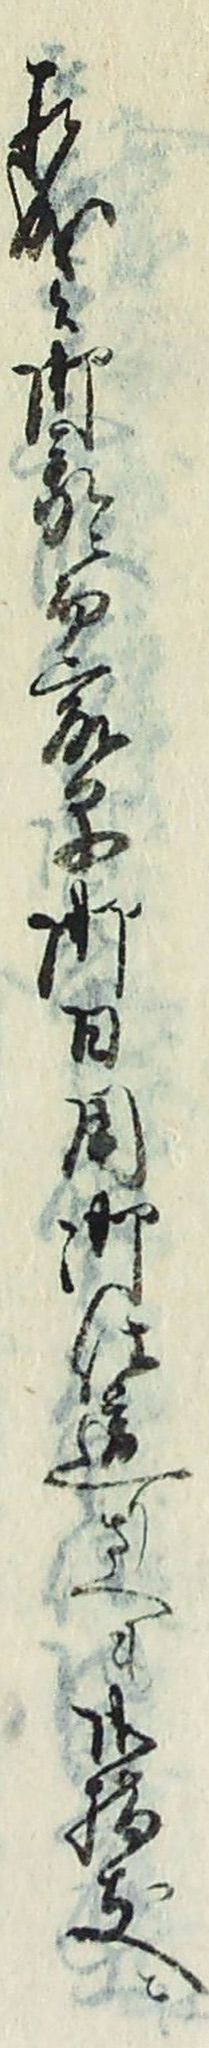相成候御義ニ而最早御日用御仕送り方へも御指支と
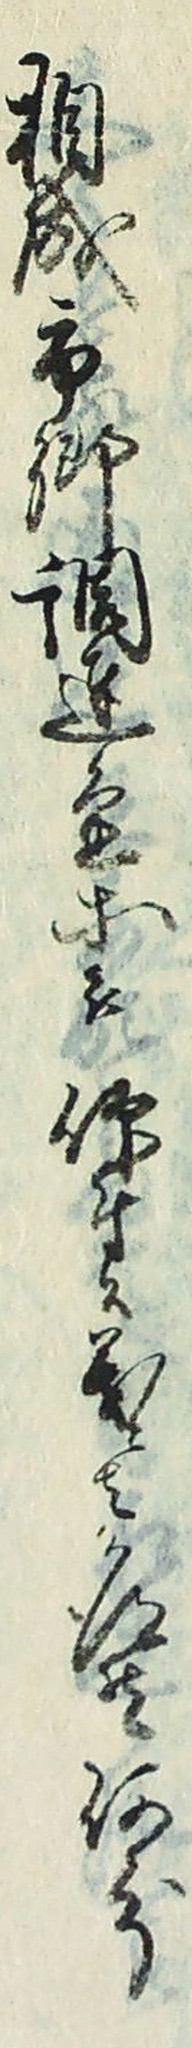相成市郷調達金等被仰付候義ニ者候得共何分
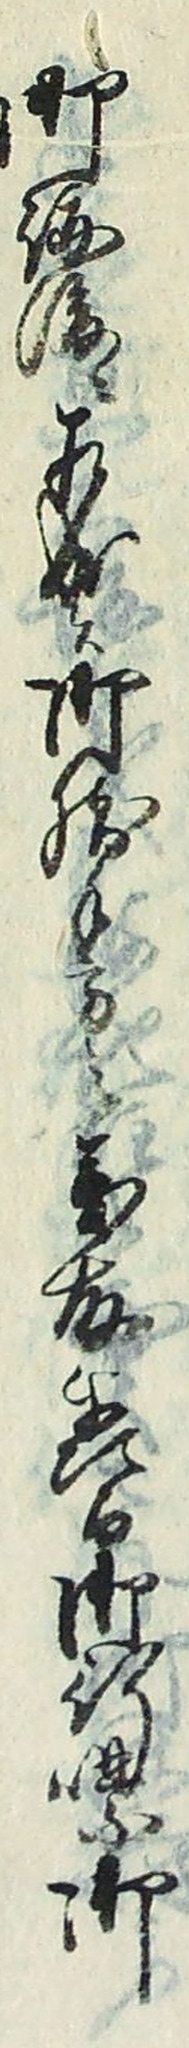御跡後ニ相成候御勝手方之義故犇と御行噤御
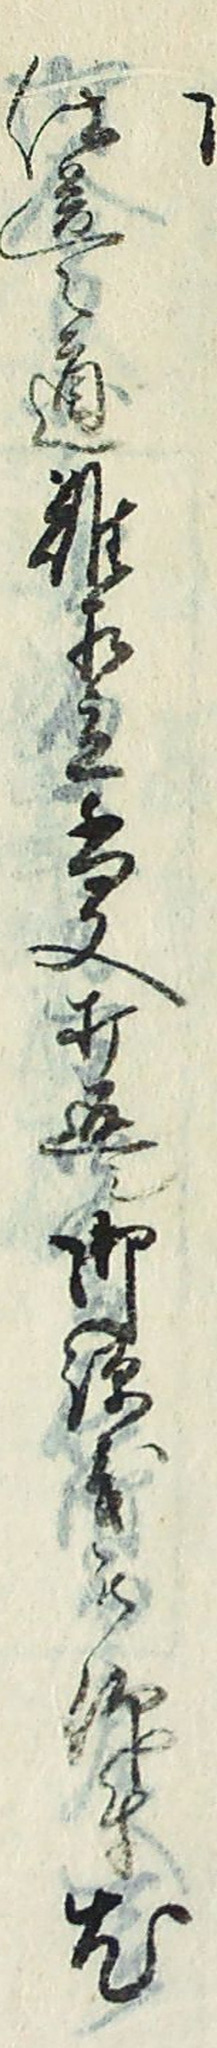仕送之道難相立尚又打返シ御評義被仰付尤
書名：諸御趣意書并御下知向之写
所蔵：鳴門教育大学 Naruto University of Education
